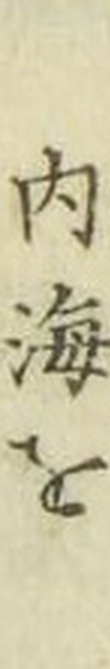内海を
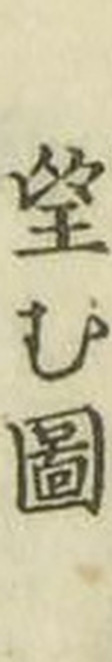望む図

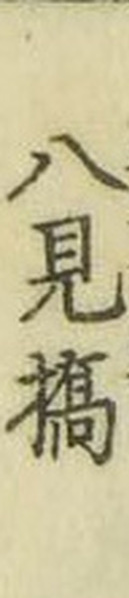八見橋
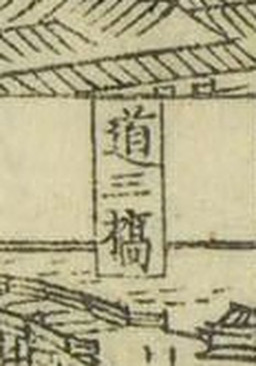道三橋
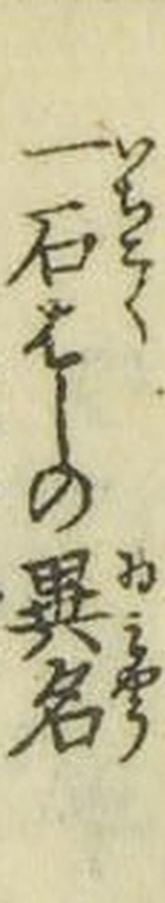一石はしの異名
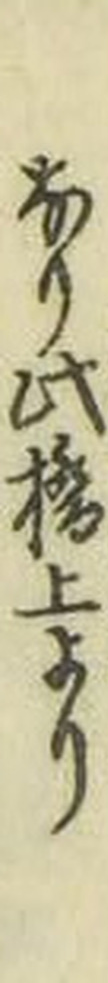なり此橋上より
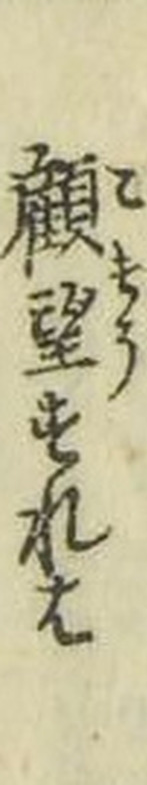顧望すれは
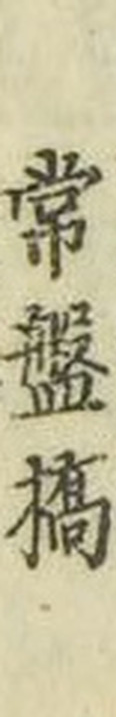常盤橋
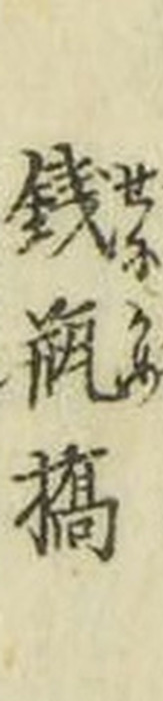銭瓶橋
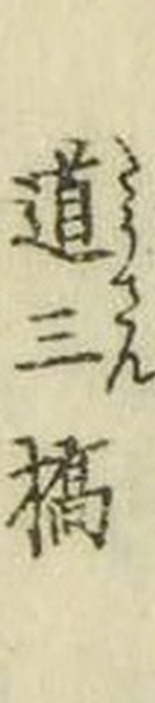道三橋
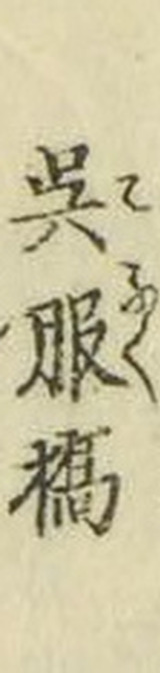呉服橋
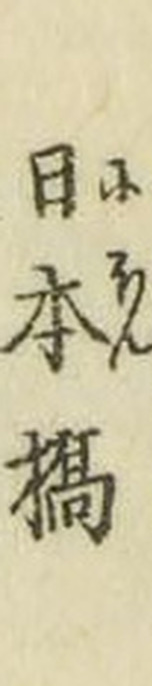日本橋
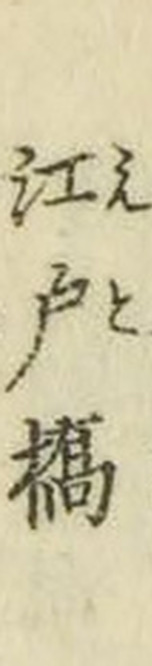江戸橋
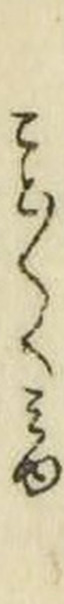こと〳〵くみゆ
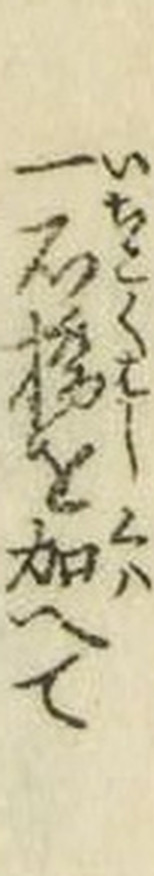一石橋を加へて
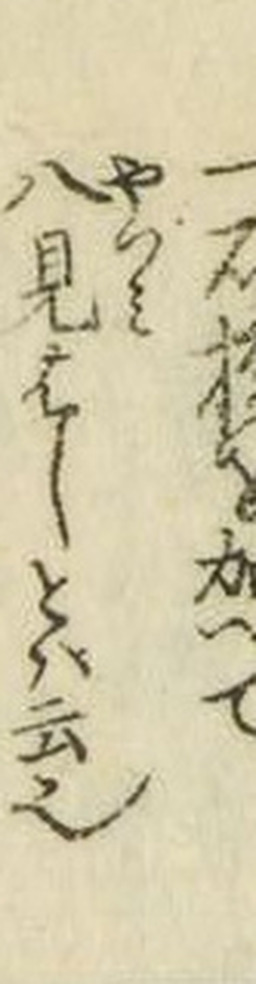八見はしとは云之
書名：江戸名所図会 20巻 巻之1
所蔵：東京学芸大学教育コンテンツアーカイブ
